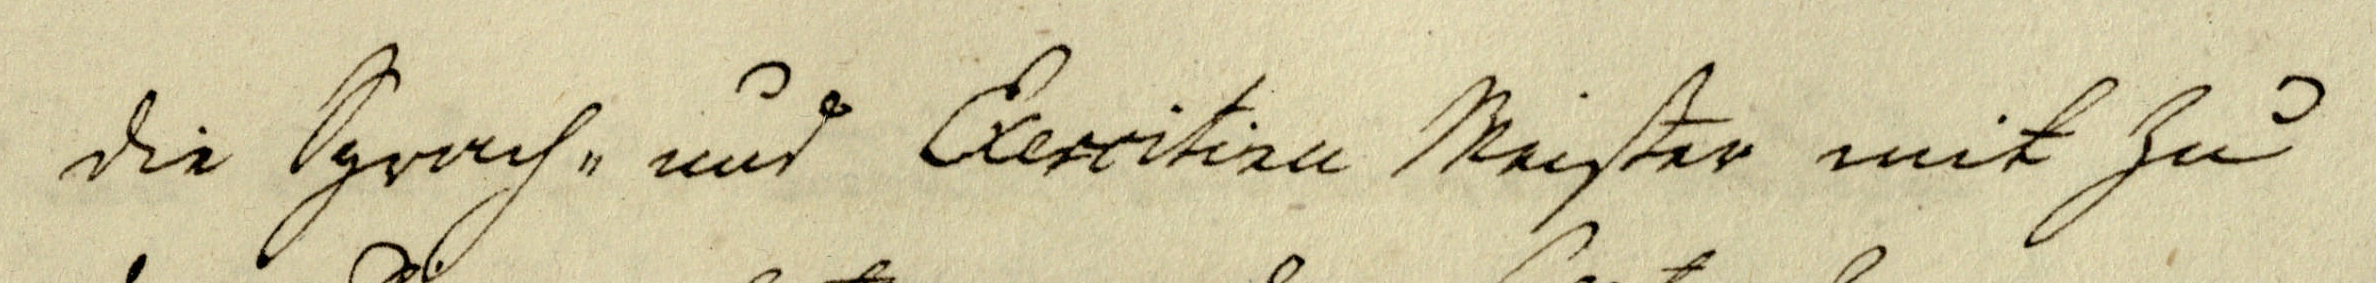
die Sprach- und Exercitien Meister mit zu
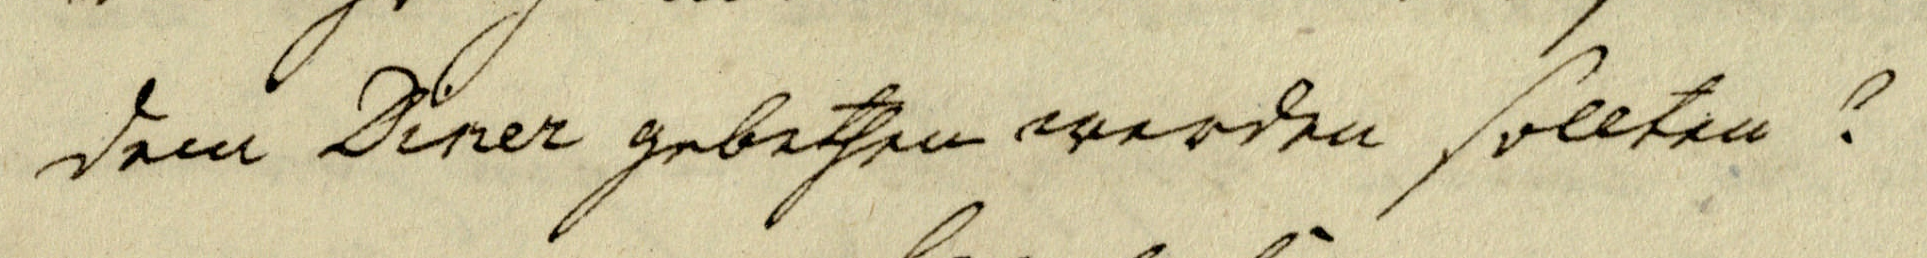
dem Diner gebethen werden sollten?
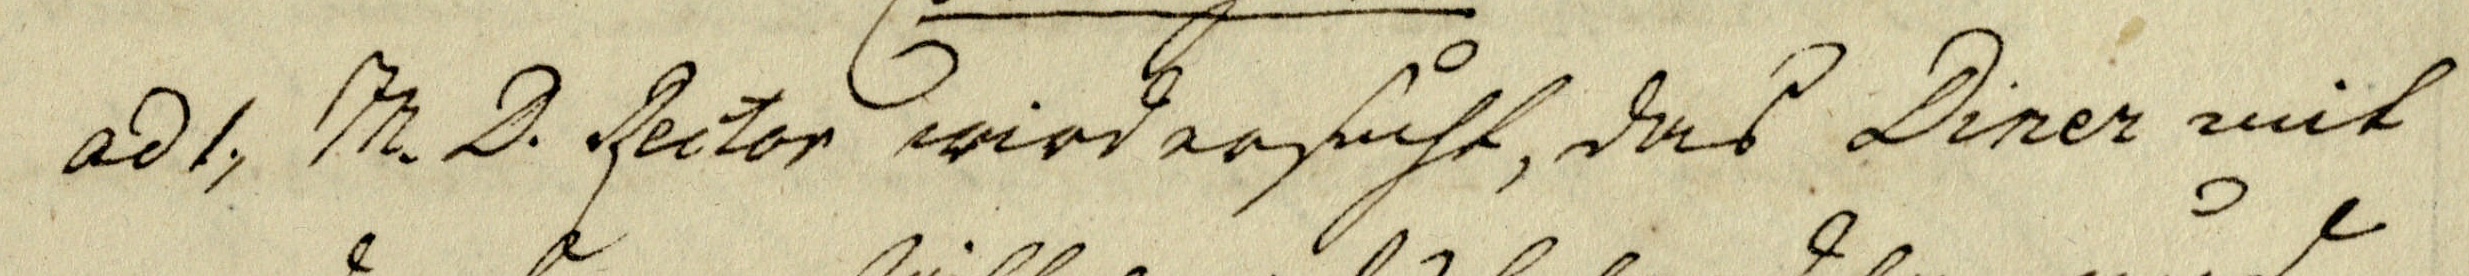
ad 1. M. D. Rector wird ersucht, das Diner mit
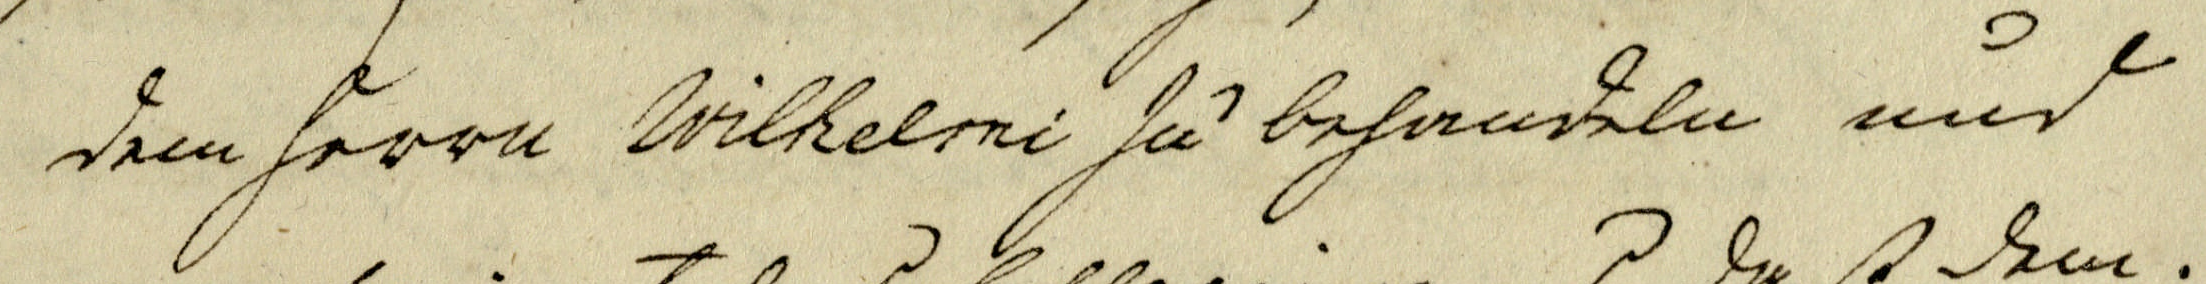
dem Herrn Wilhelmi zu behandeln und
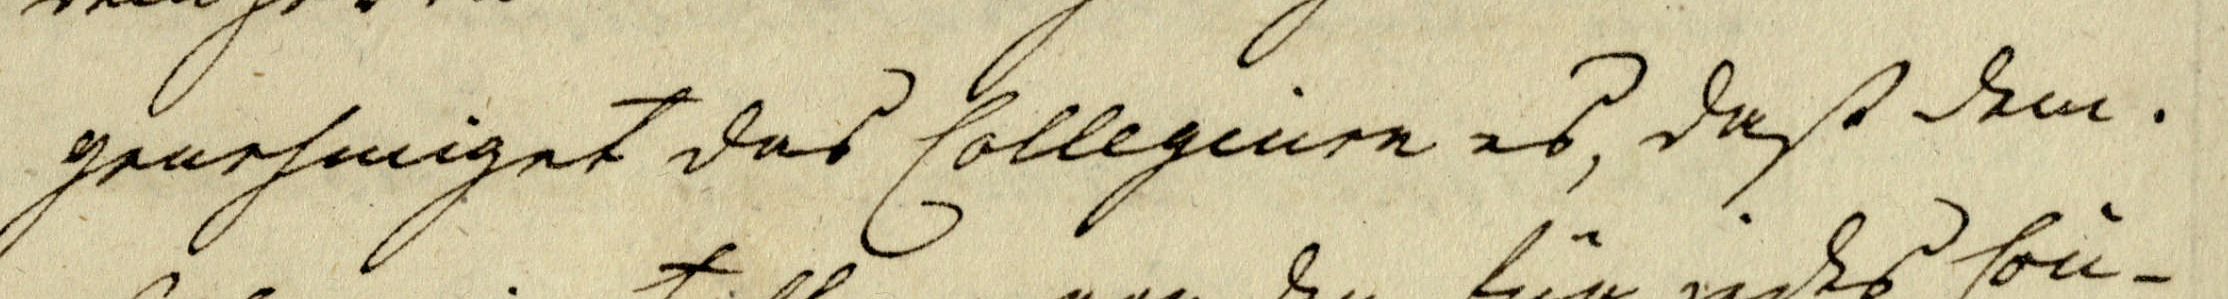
genehmiget das Collegium es, daß dem¬
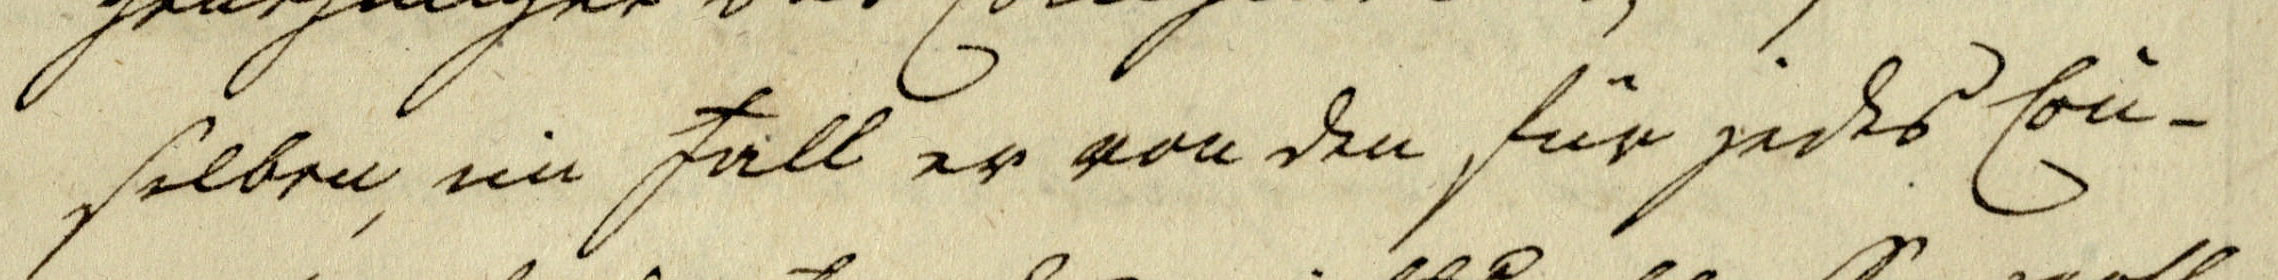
selben, im Fall er von den für jedes Cou¬
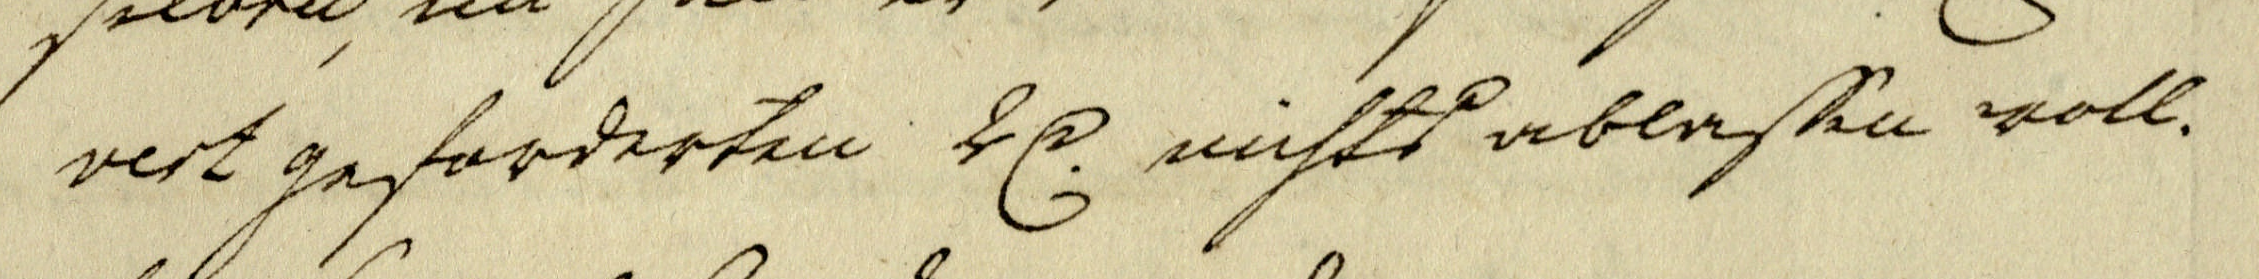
vert geforderten 2 l. nichts ablassen woll¬
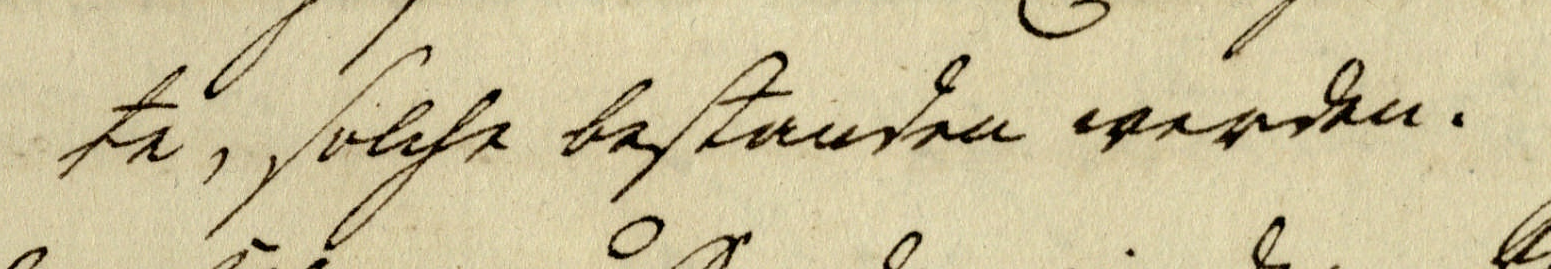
te, solche bestanden werden.
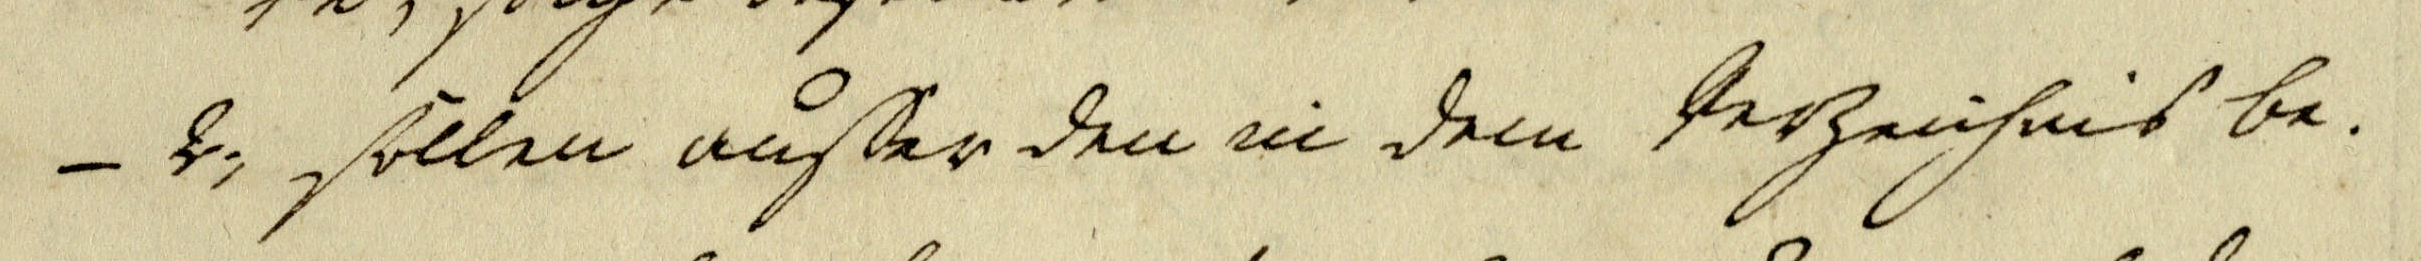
2., sollen ausser den in dem Verzeichnis be¬
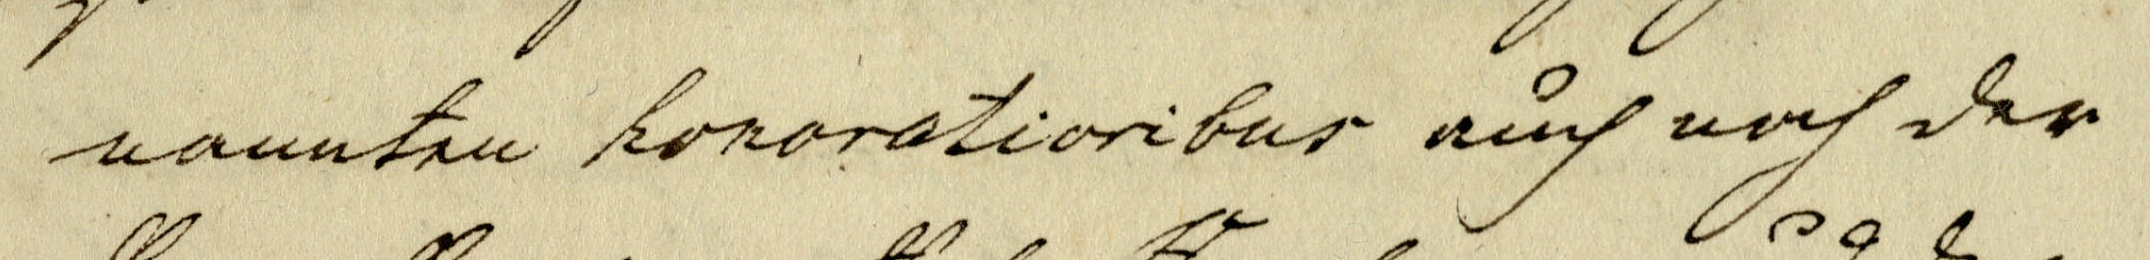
nannten honoratioribus auch noch der
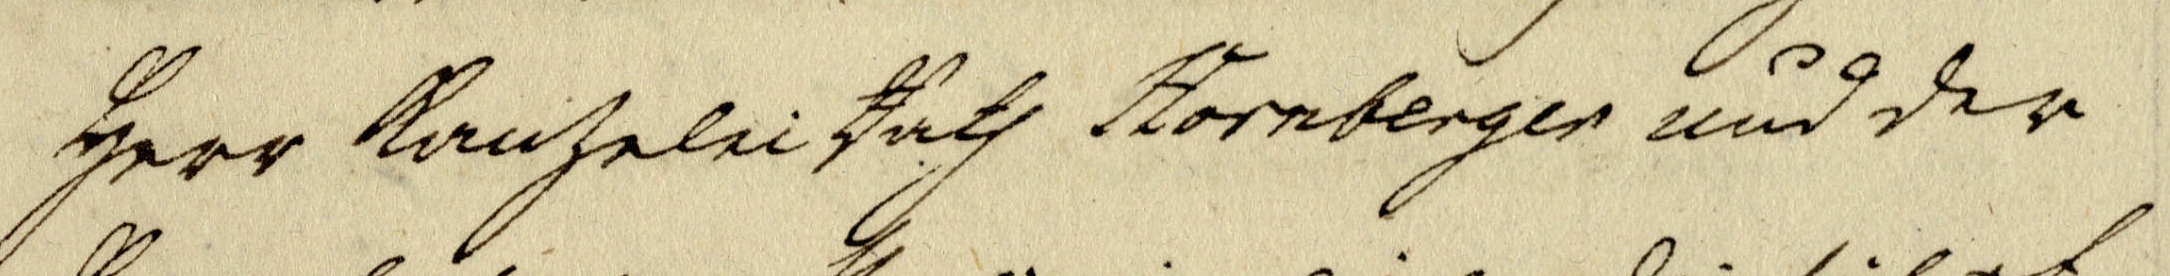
Herr Kanzelei Rath Hornberger und der
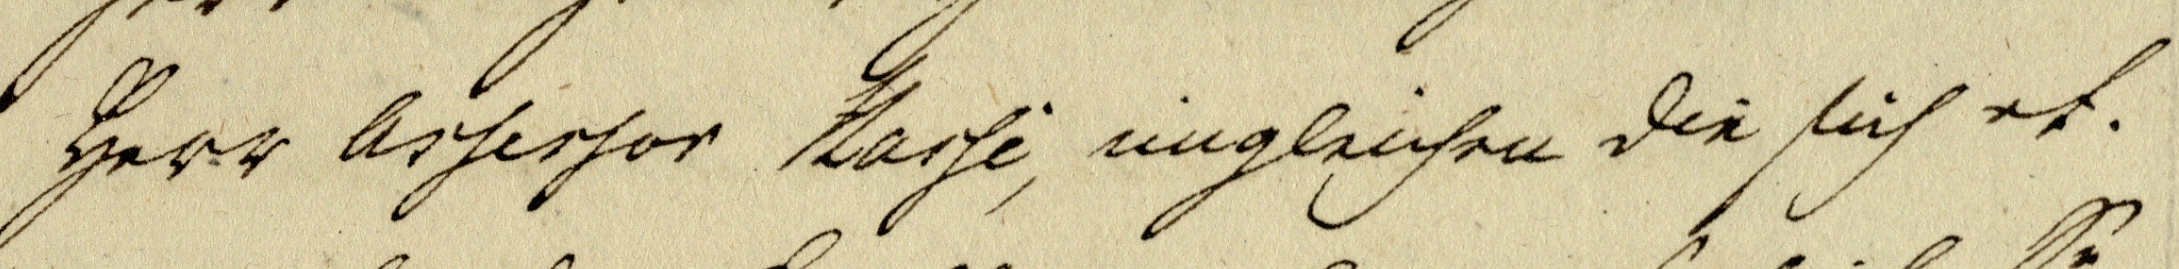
Herr Assessor Hasse, imgleichen die sich et¬
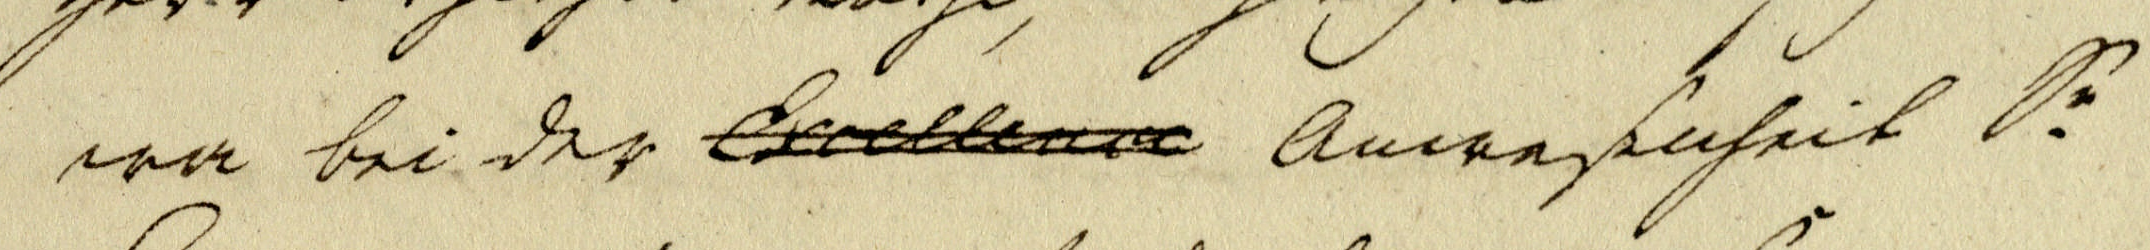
wa bei der Excellence Anwesenheit Sr
